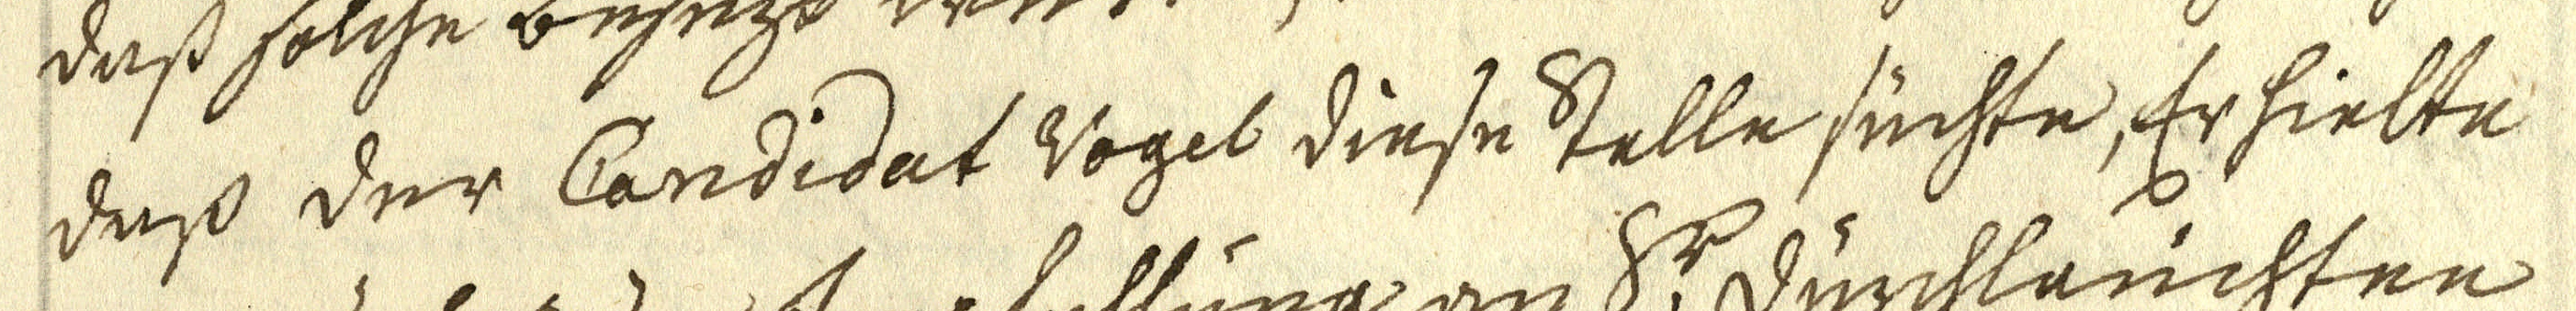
daß der Candidat Vogel diese Stelle suchte, Er hielte
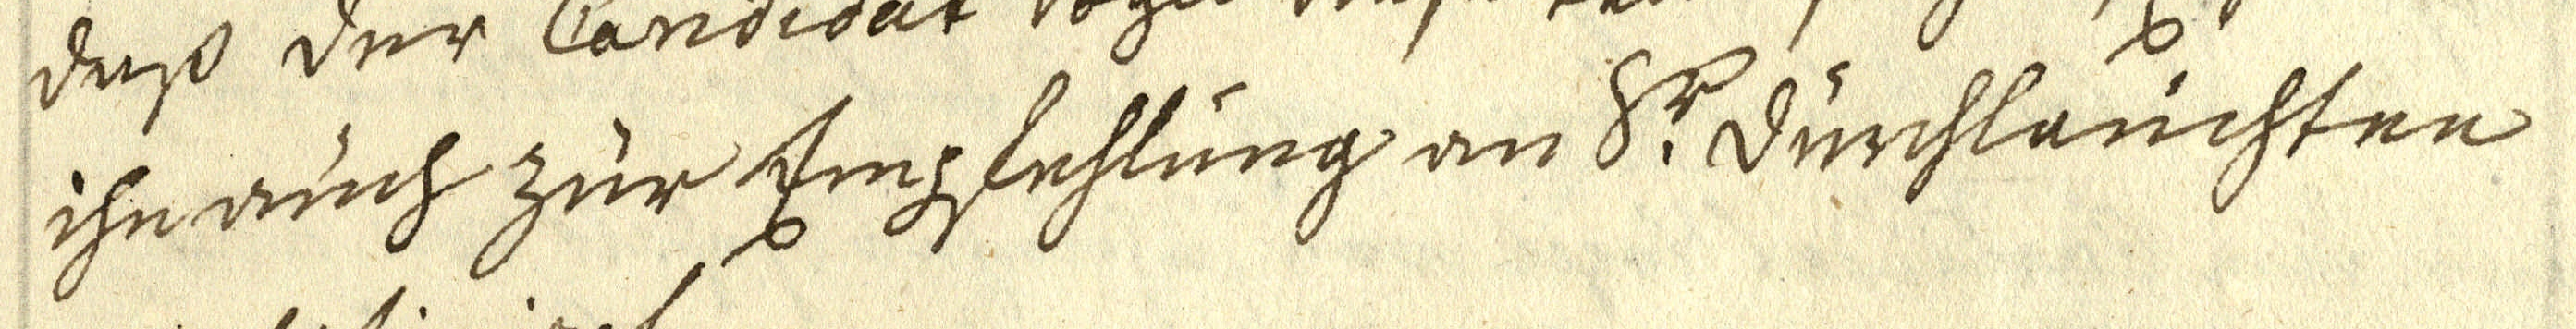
ihn auch zur Empfehlung an Sr Durchlauchten
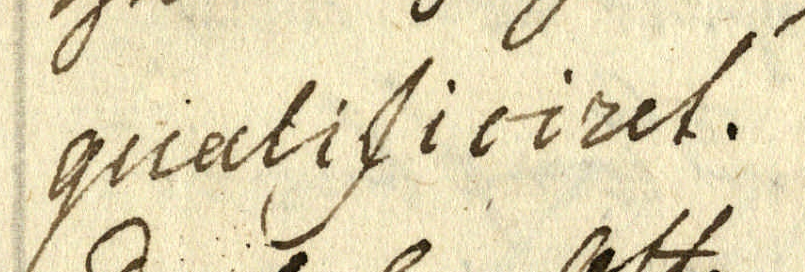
qualificiret.
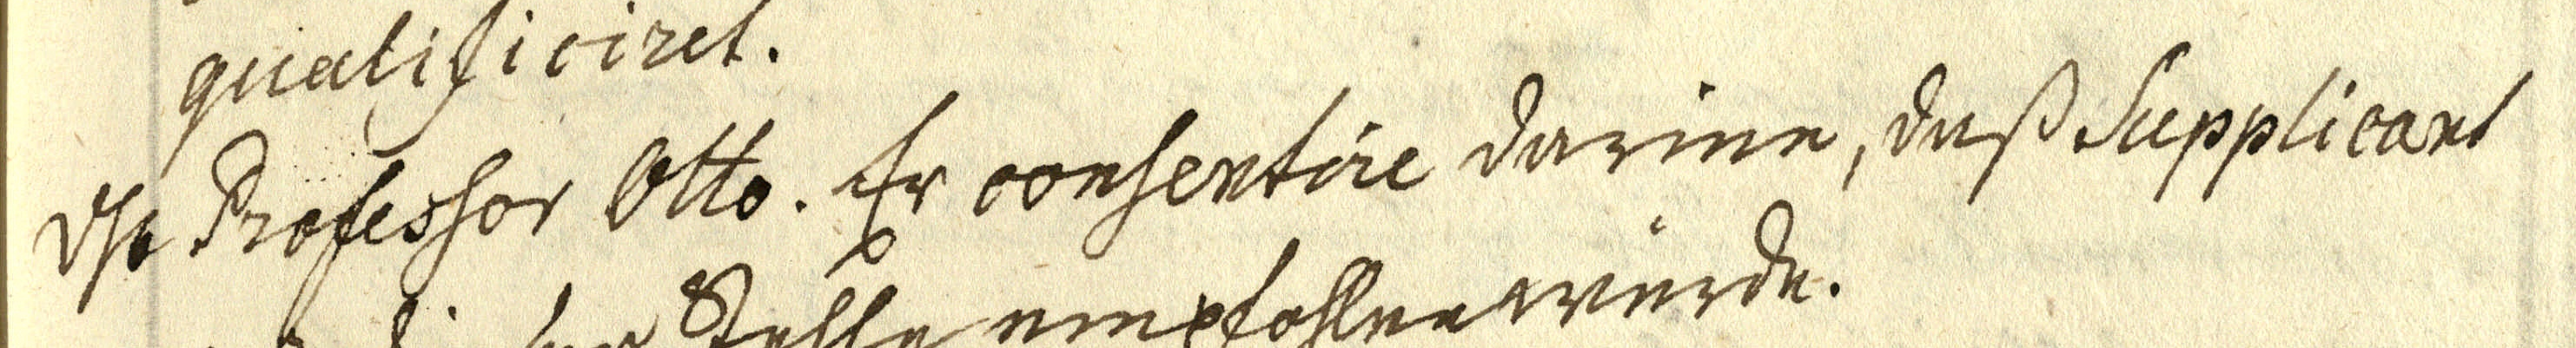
dh Professor Otto. Er consentire darin, daß Supplicant
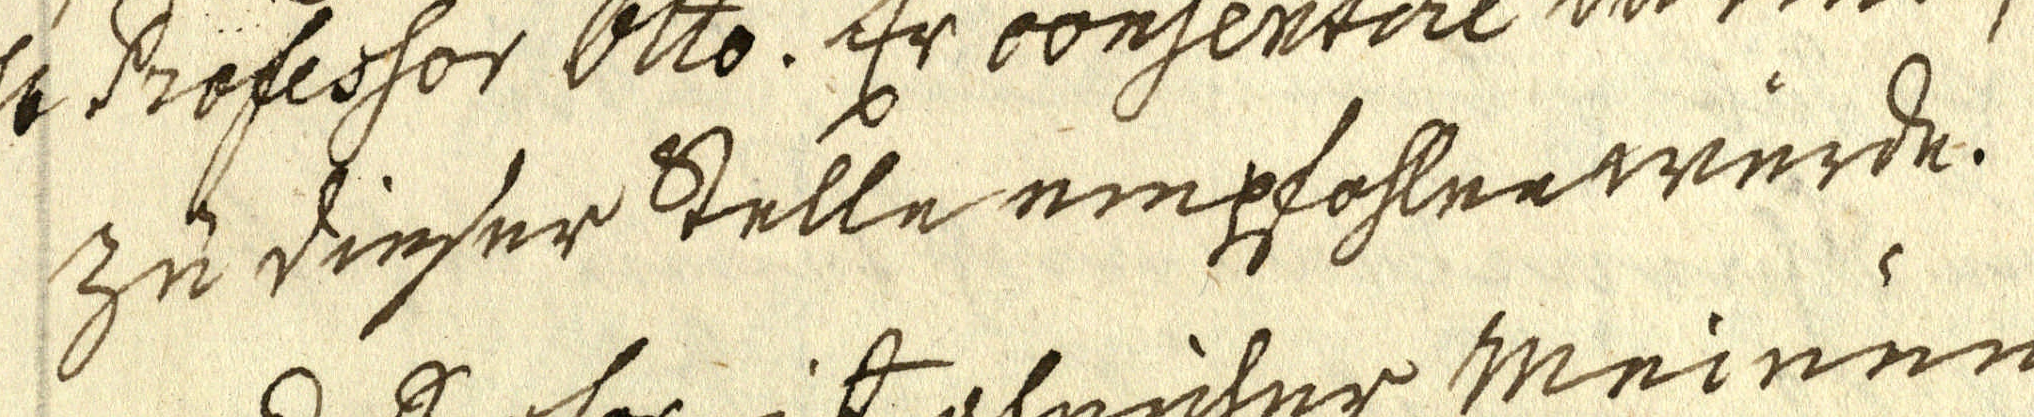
zu dieser Stelle empfohlen würde.
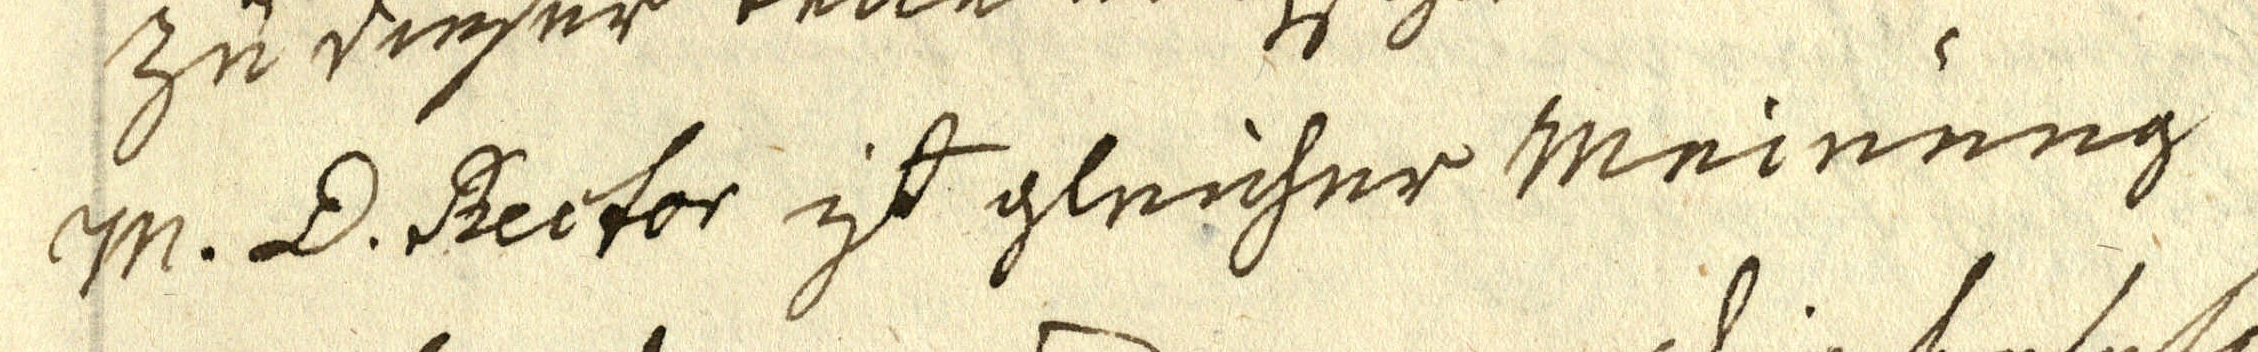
M. D. Rector ist gleicher Meinung.
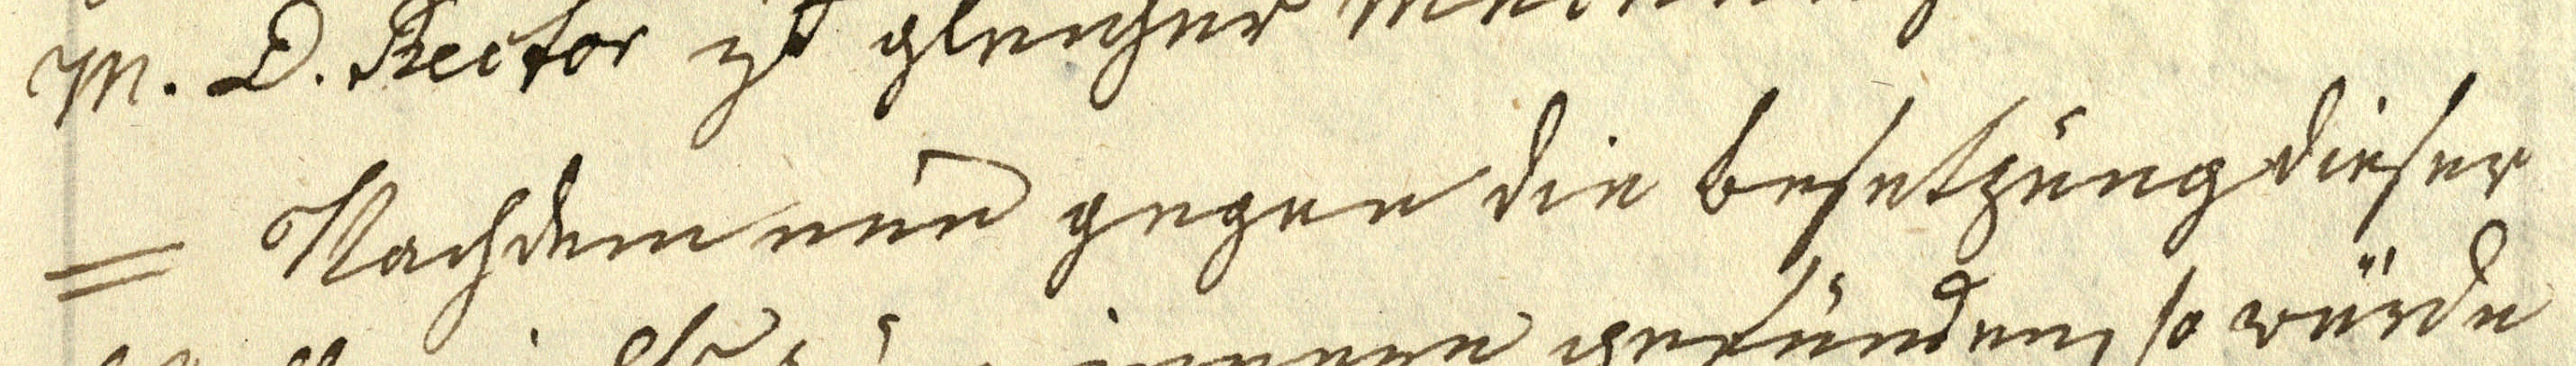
Nachdem nun gegen die Besetzung dieser
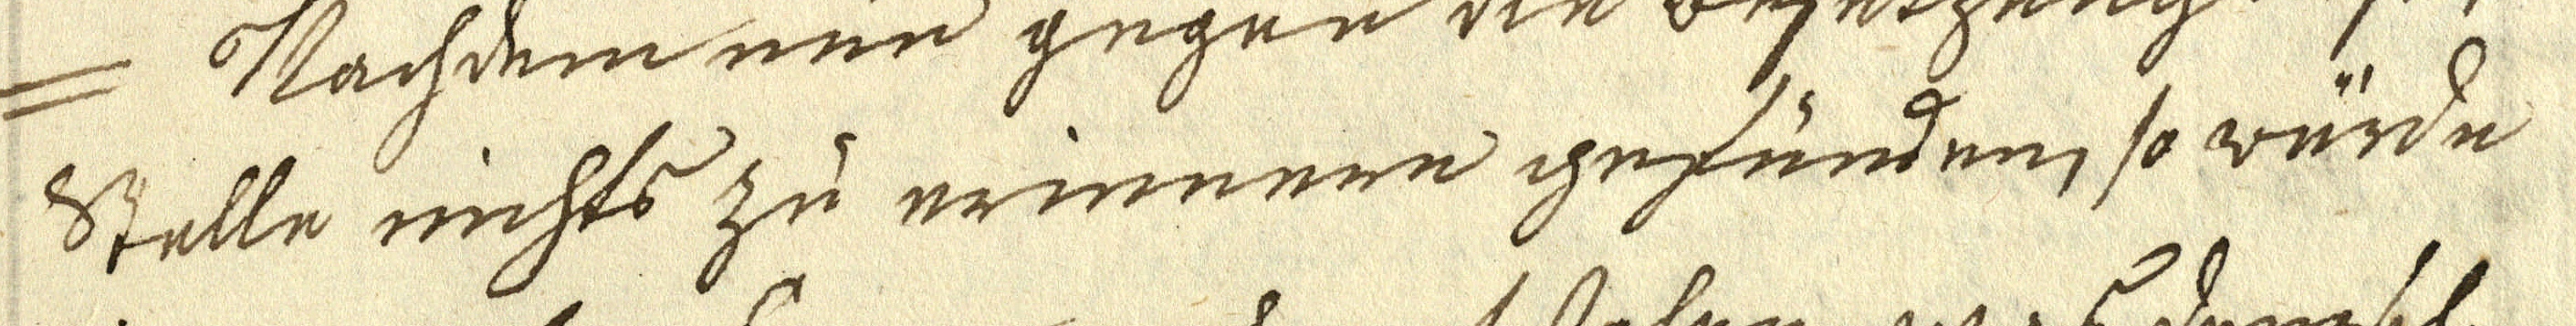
Stelle nichts zu erinnern gefunden, so würde
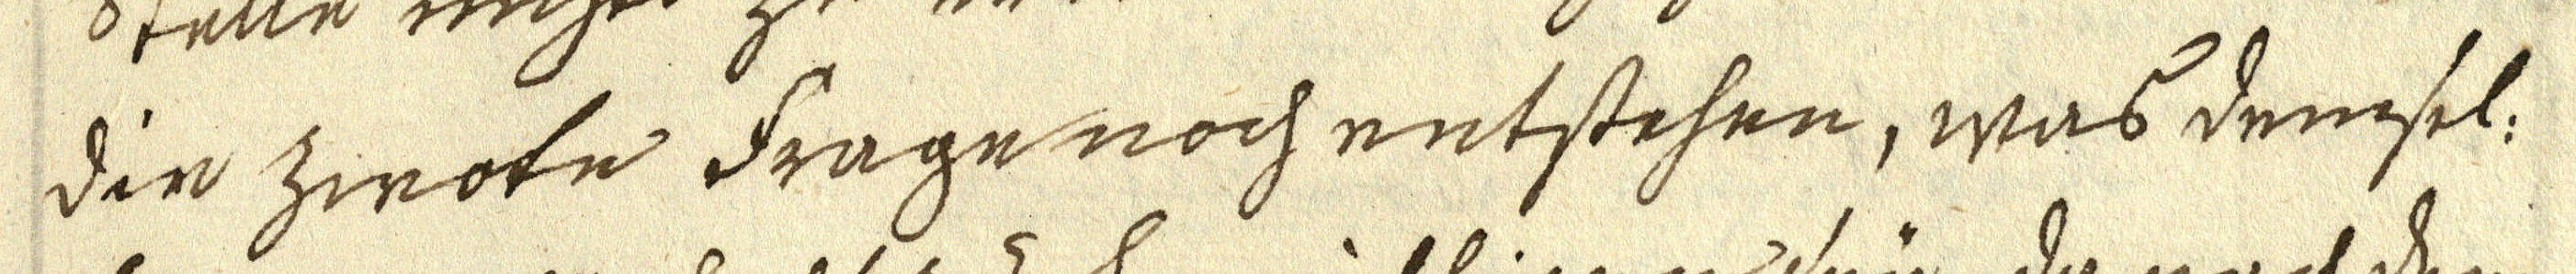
die zwote Frage noch entstehen, was demsel¬
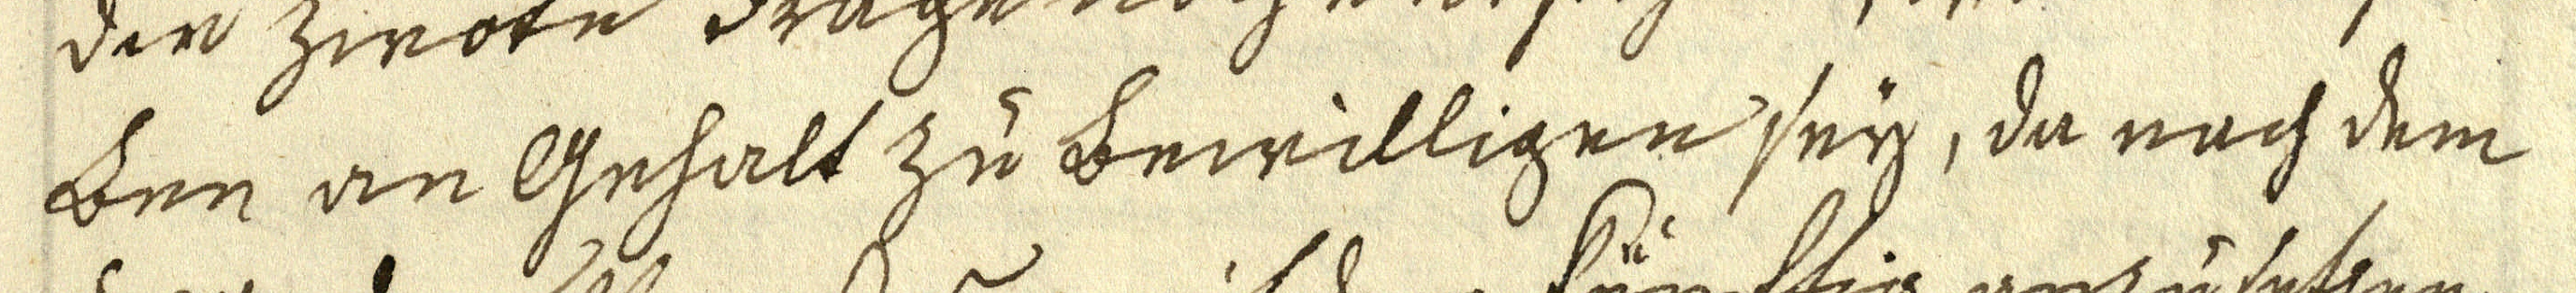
ben an Gehalt zu bewilligen seÿ, da nach dem
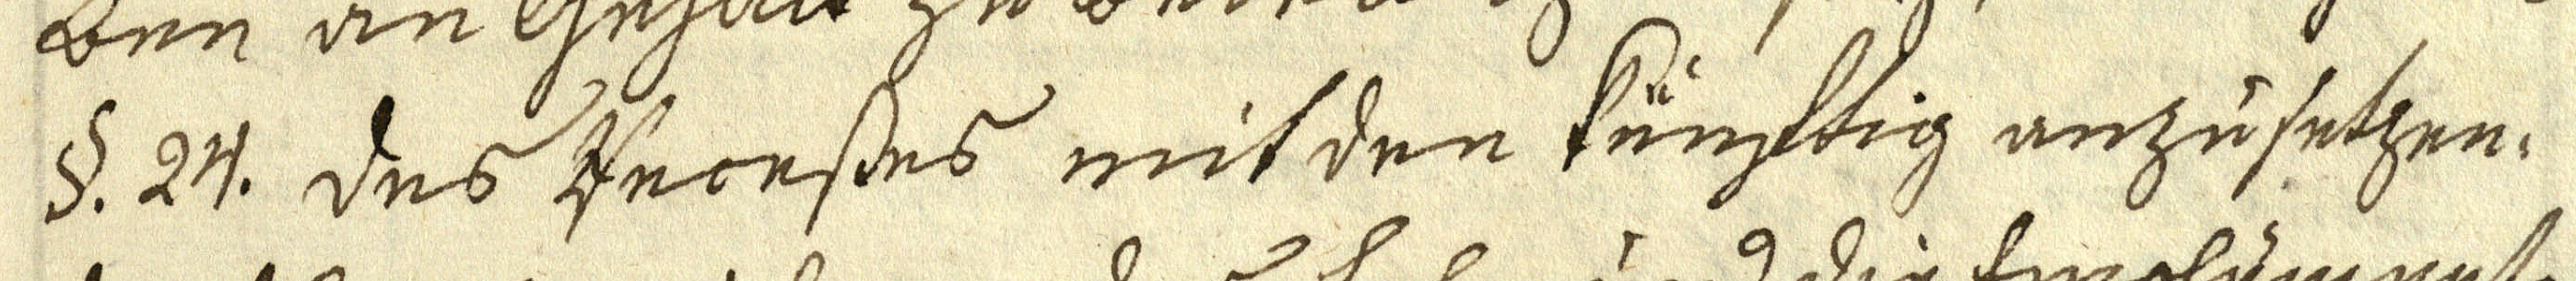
§. 24. des Receßes mit den künftig anzusetzen¬
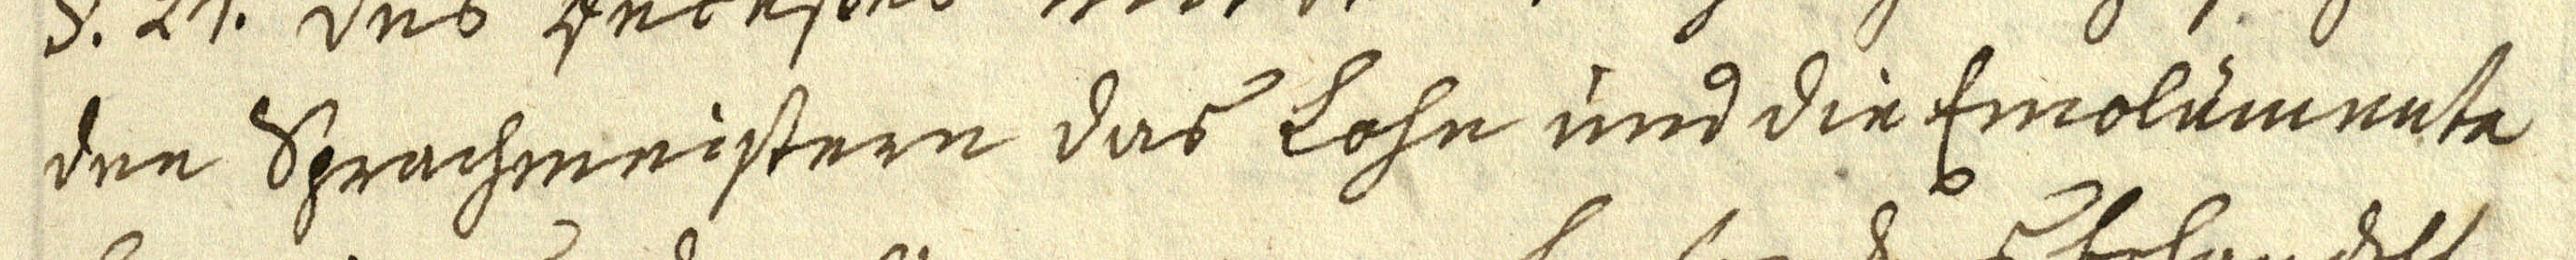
den Sprachmeistern das Lohn und die Emolumente
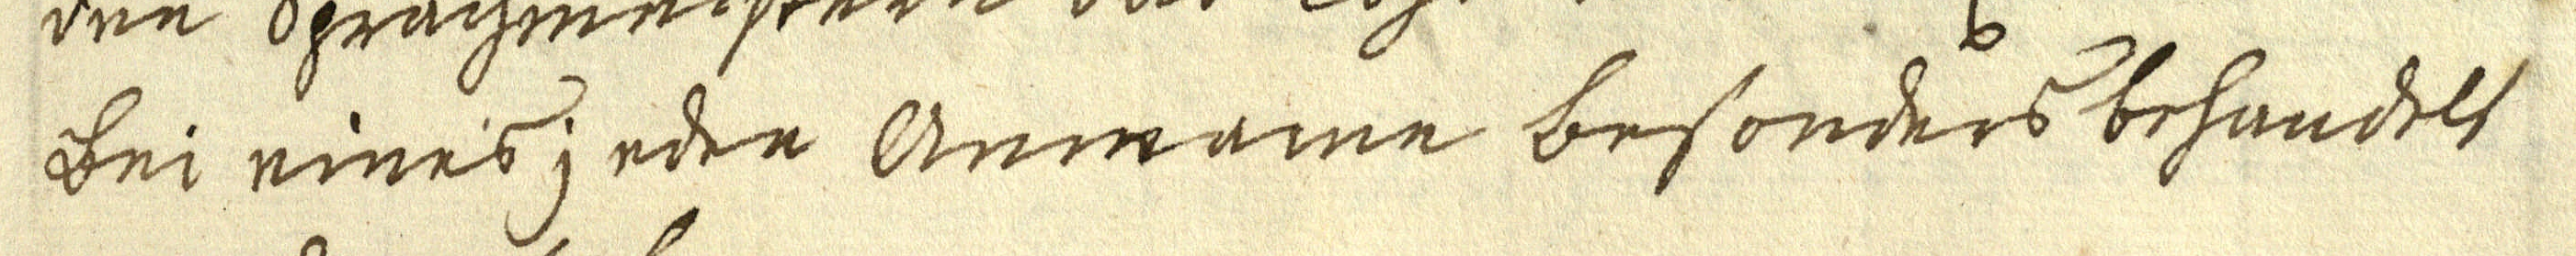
bei eines jeden Anname besonders behandelt
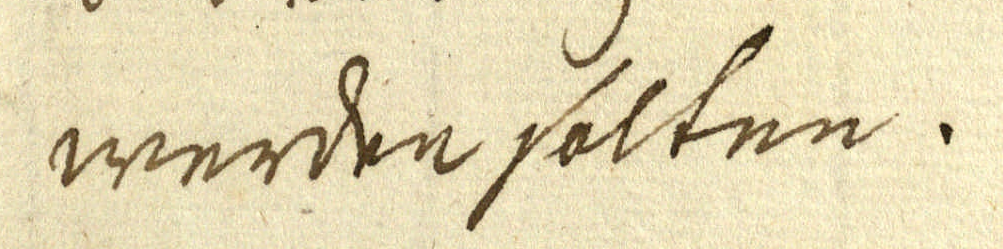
werden solten.
